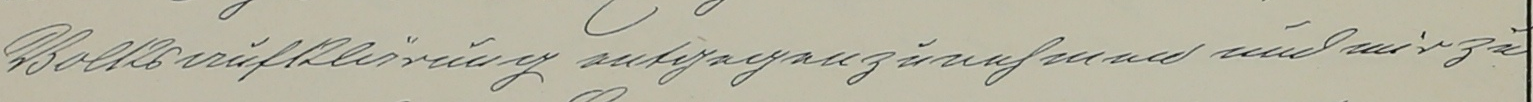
Volksaufklärung entgegenzunehmen und mir zu
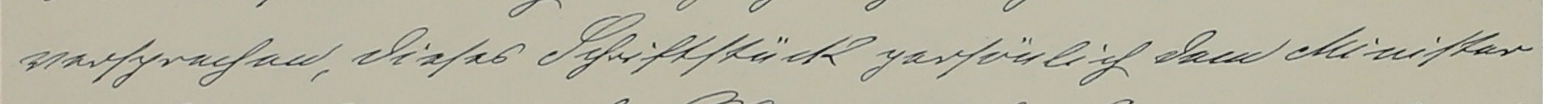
versprechen, dieses Schriftstück persönlich dem Minister
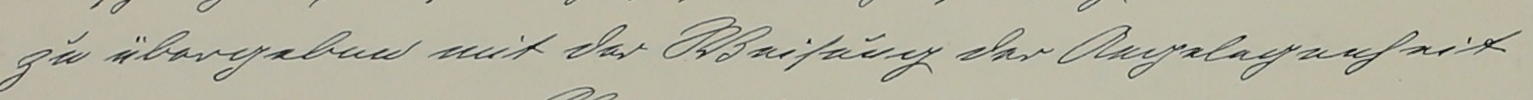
zu übergeben mit der Weisung der Angelegenheit
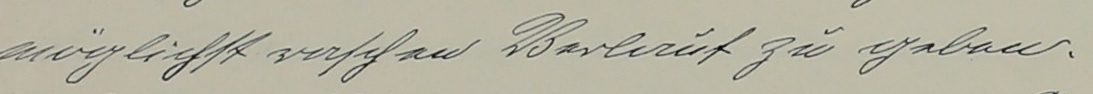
möglichst raschen Verlauf zu geben.
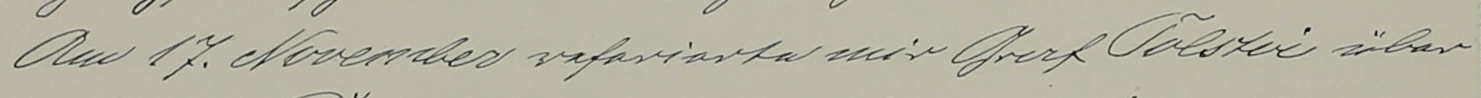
Am 17. November referierte mir Graf Tolstoi über
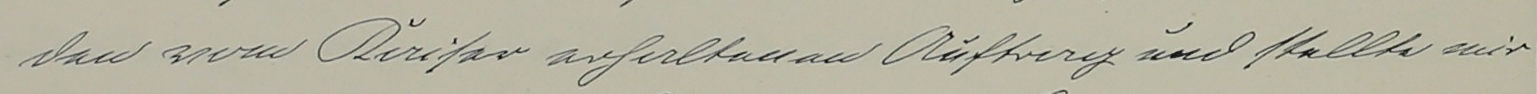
den vom Kaiser erhaltenen Auftrag und stellte mir
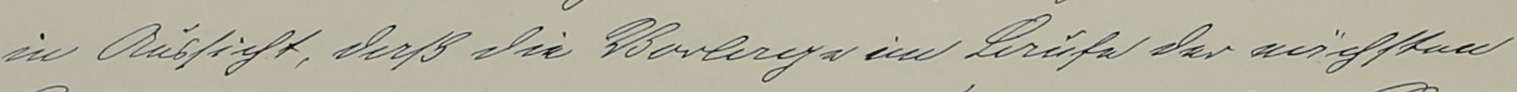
in Aussicht, daß die Vorlage im Laufe der nächsten
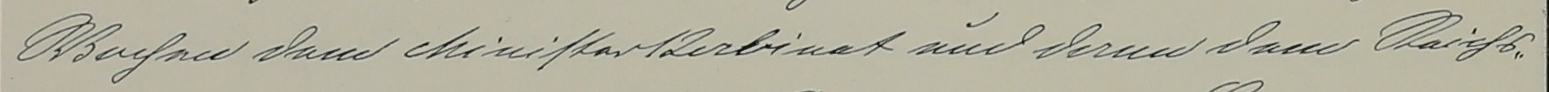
Wochen dem Ministerkabinet und dann dem Reichs-
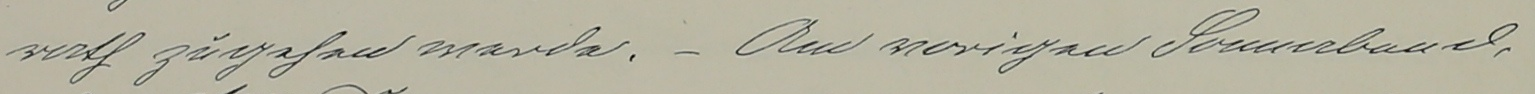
rath zugehen werde. – Am vorigen Sonnabend,
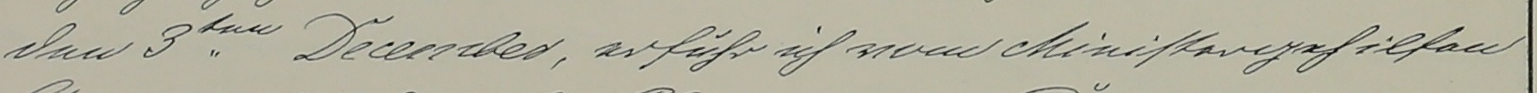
den 3ten December, erfuhr ich vom Ministergehilfen
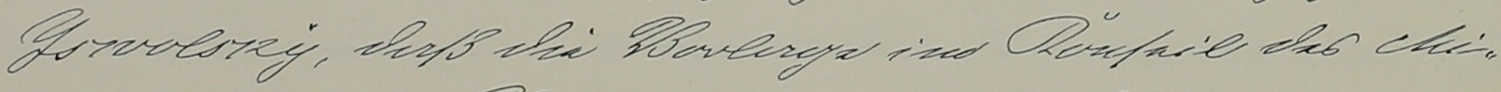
Iswolsky, daß die Vorlage im Konseil des Mi-
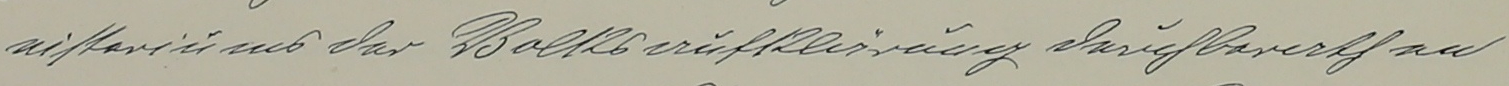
nisteriums der Volksaufklärung durchberathen
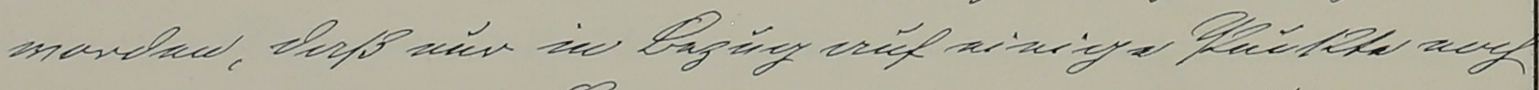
worden, daß nur in Bezug auf einige Punkte noch
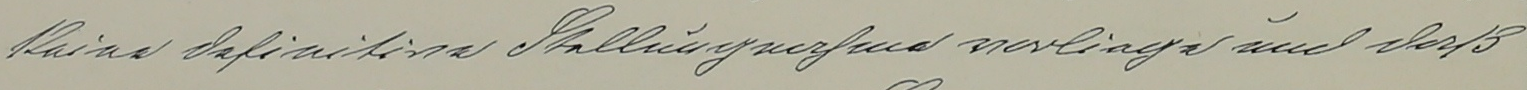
keine definitive Stellungnahme vorliege und daß
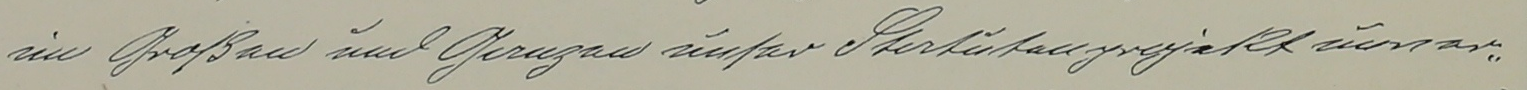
im Großen und Ganzen unser Statutenprojekt unver-
